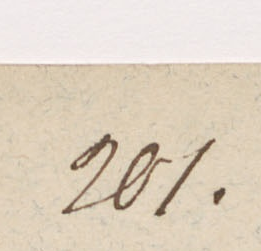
201.
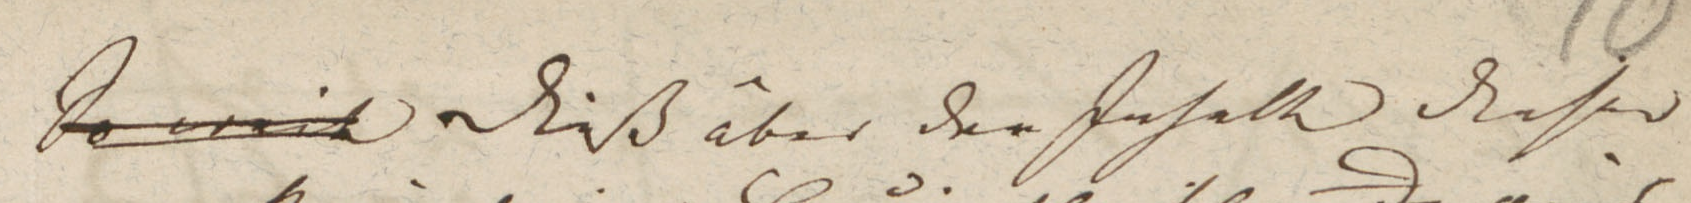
So weit Diess über den Inhalt dieser
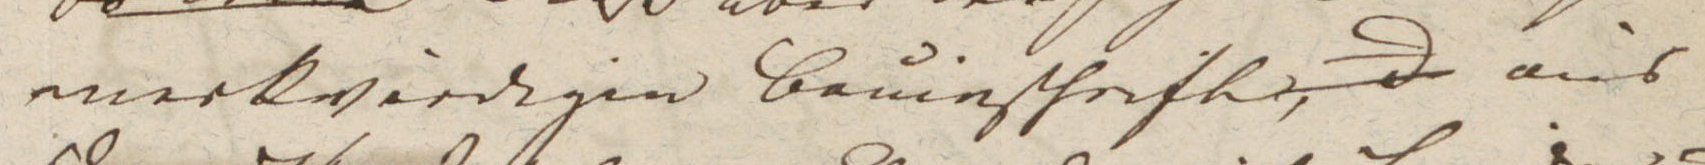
merkwürdigen Bauinschrift, d aus
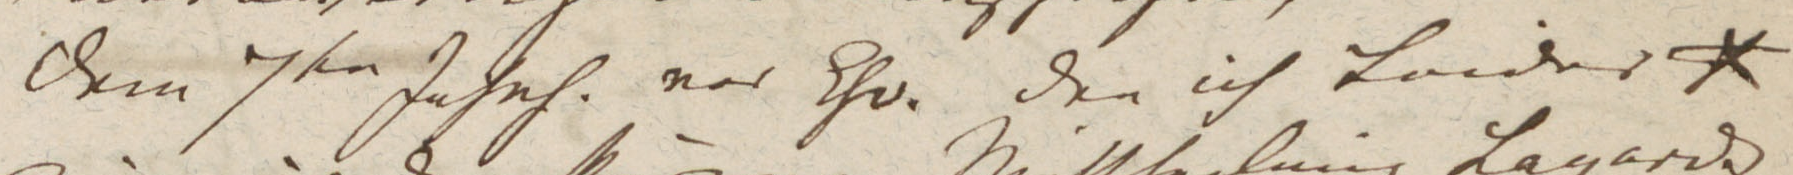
dem 7ten Jahrh. vor Chr. den ich Leider
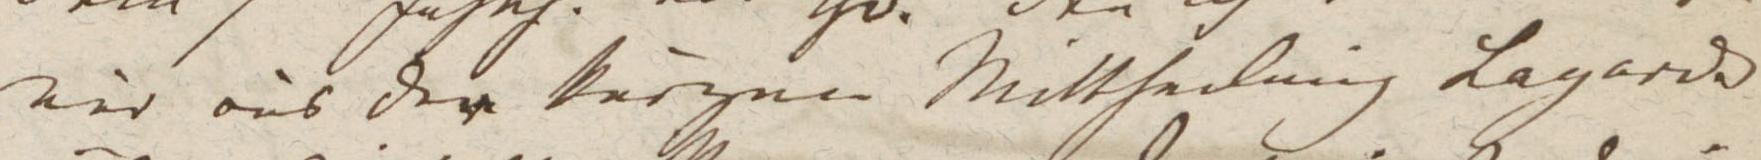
nur aus denr kurzen Mittheilung Layards %
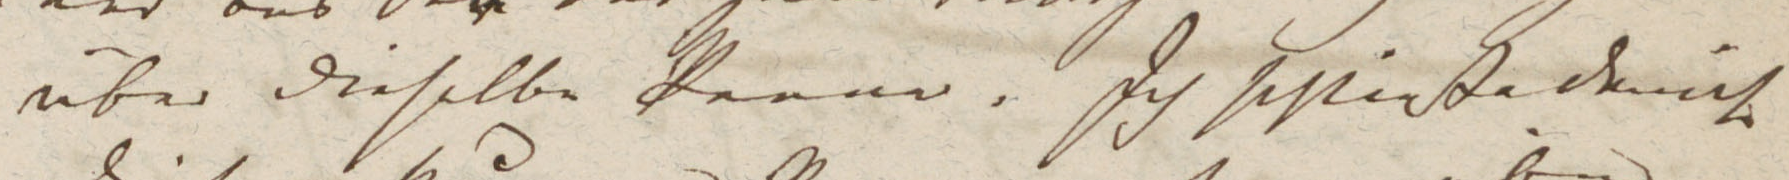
über dieselbe kenne. Ich schliesse damit
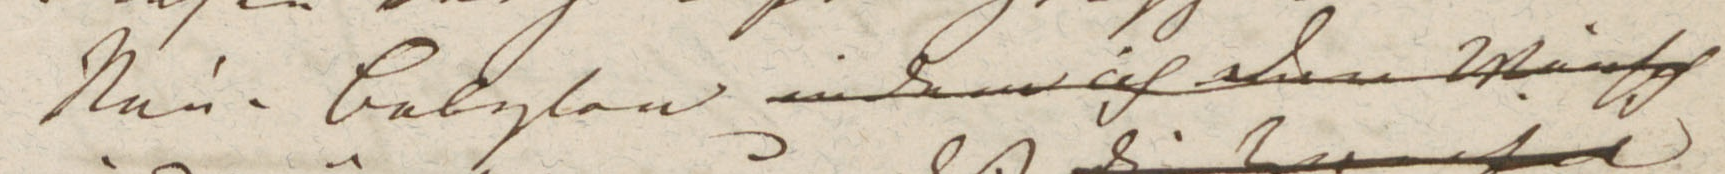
Neu-Babylon indem ich den Wunsch
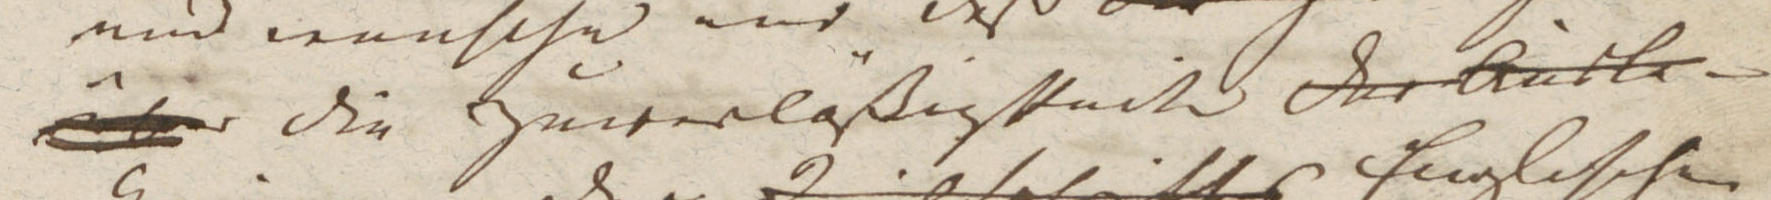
über die Zuverlässigkeit der Ausle-
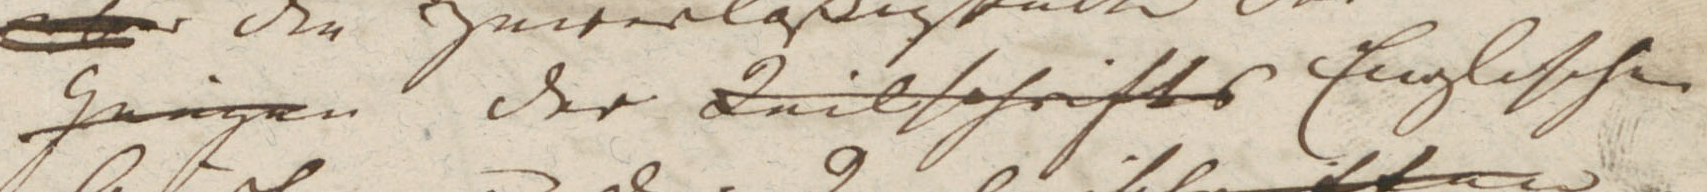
gungen der Keilschrifts Englischen
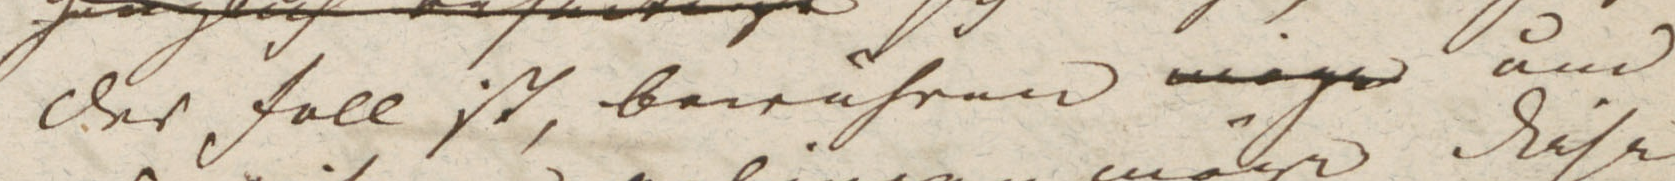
der Fall ist, bewähren möge und
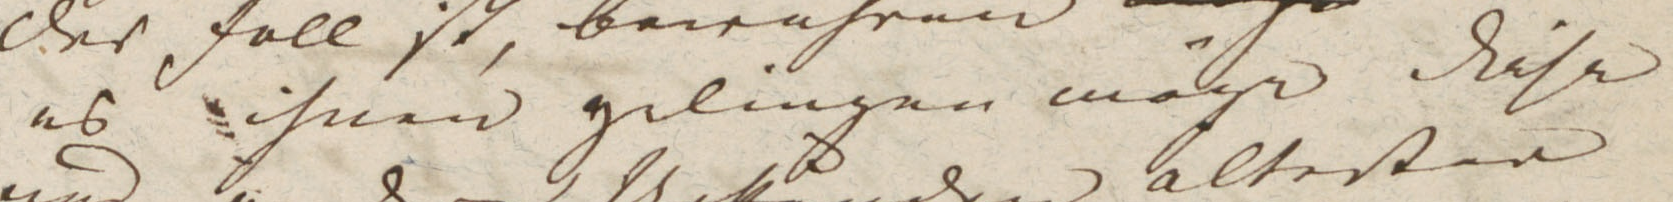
es ihnen gelingen möge diese
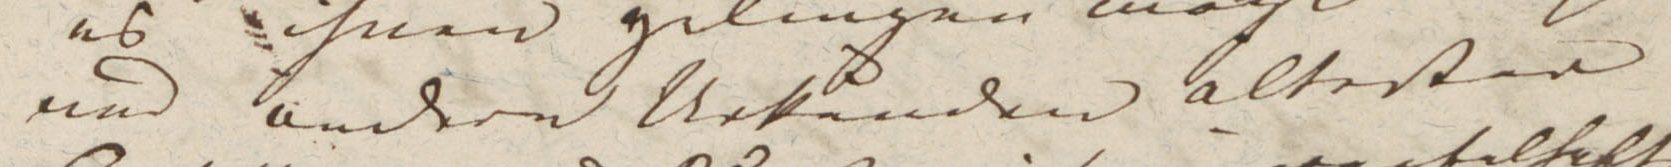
und andere Urkunden ältester
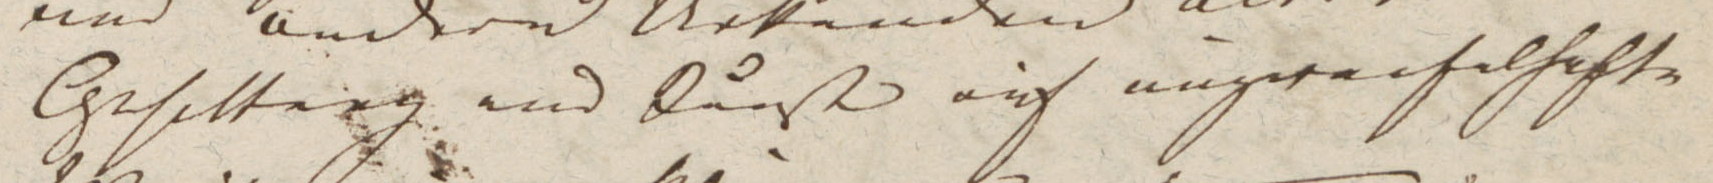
Gesittung und Kunst auf unzweifelhafte
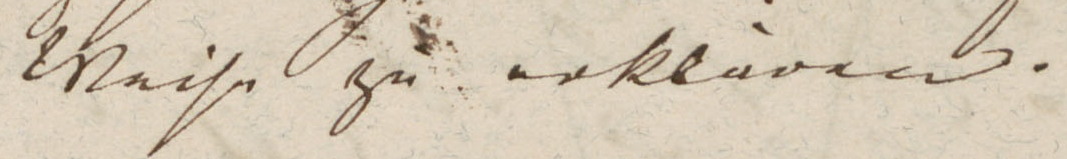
Weise zu erklären. – .
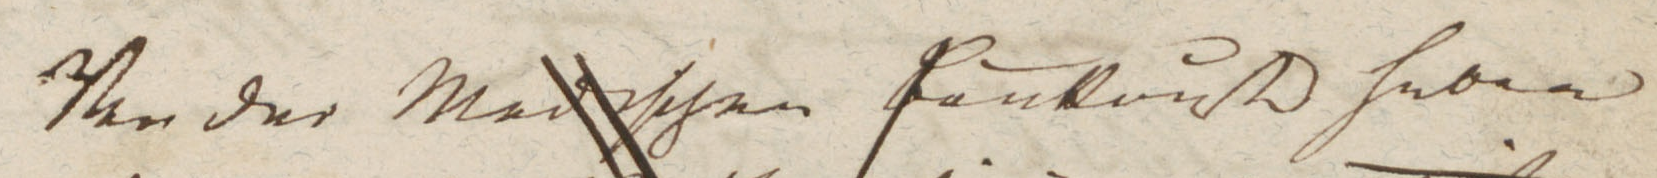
Von der Medischen Baukunst haben
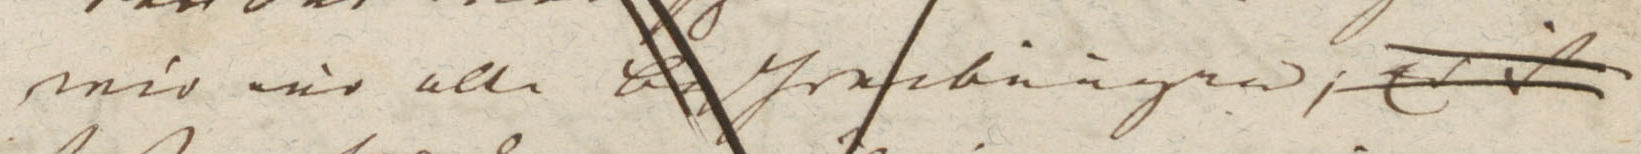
wir nur alte Beschreibungen; Es ist
